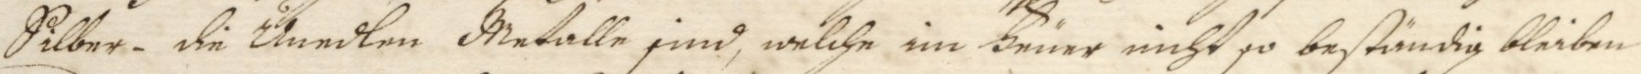Silber - die Unedlen Metalle sind, welche im Feüer nicht so beständig bleiben
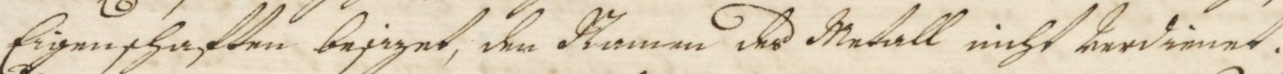Eigenschaften besizet, den Namen des Metall nicht verdienet.
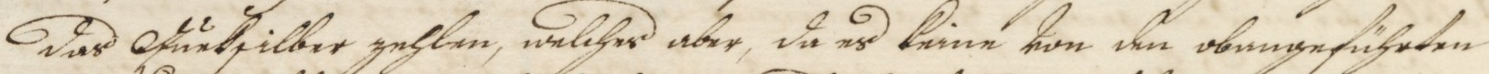das Queksilber zehlen, welches aber, da es keine von den obangeführten
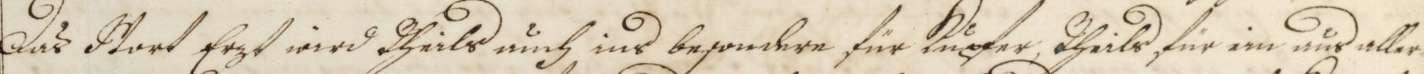Das Wort Erzt wird Theils auch ins besondere für Kupfer, Theils für ein aus aller
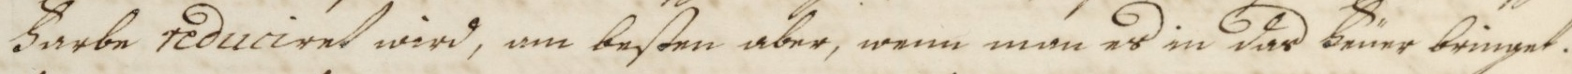Farbe reduciret wird, am besten aber, wenn man es in das Feüer bringet.
